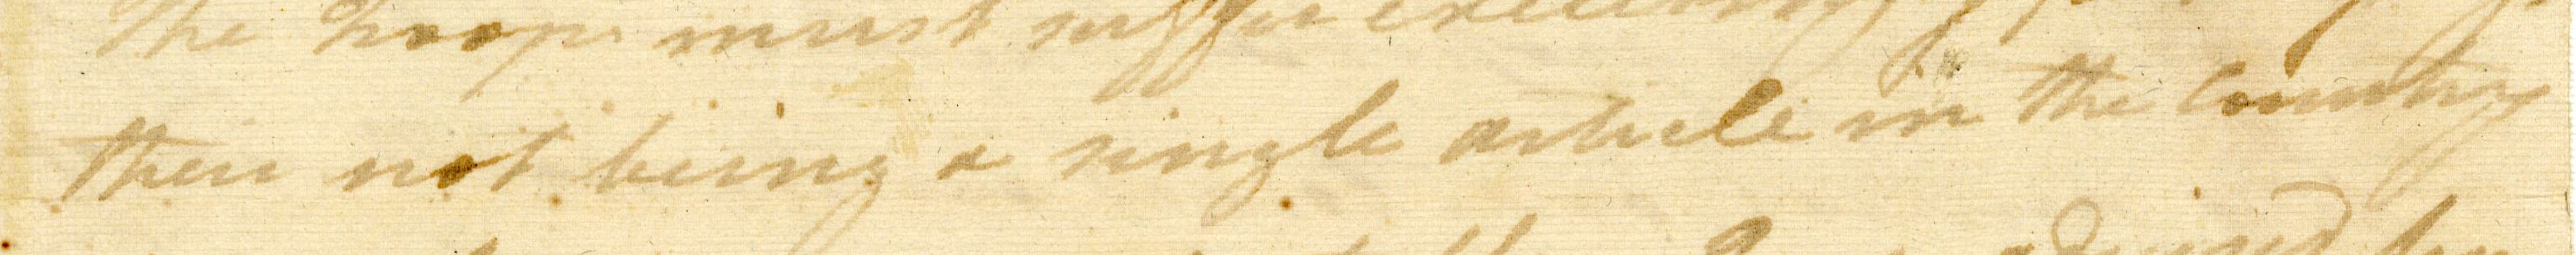there not being a single article in the Country
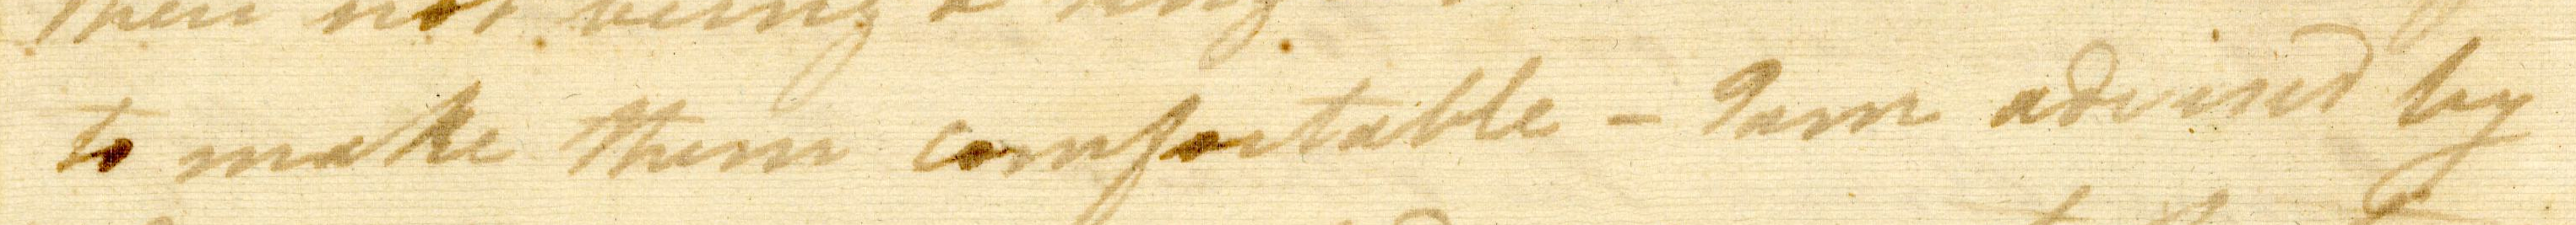to make them comfortable- I am advised by
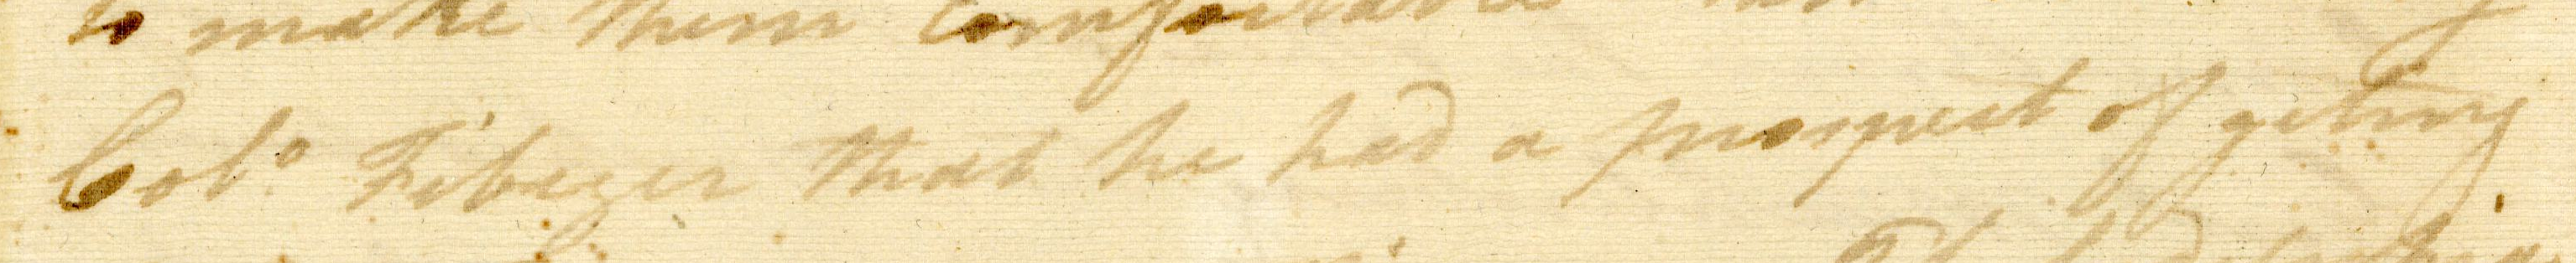Col^o. Febiger that he had a prospect of geting
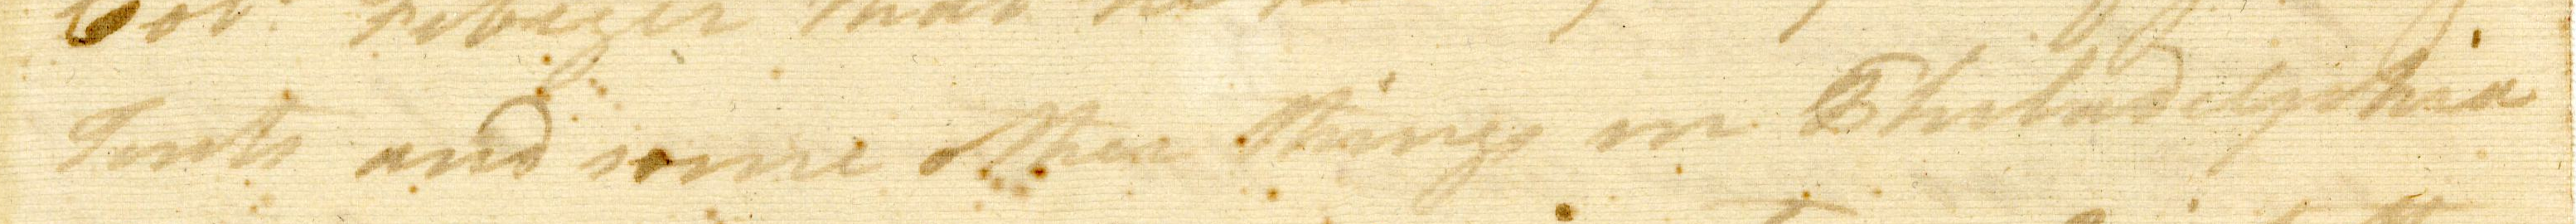Tents and some other things in Philadelphia
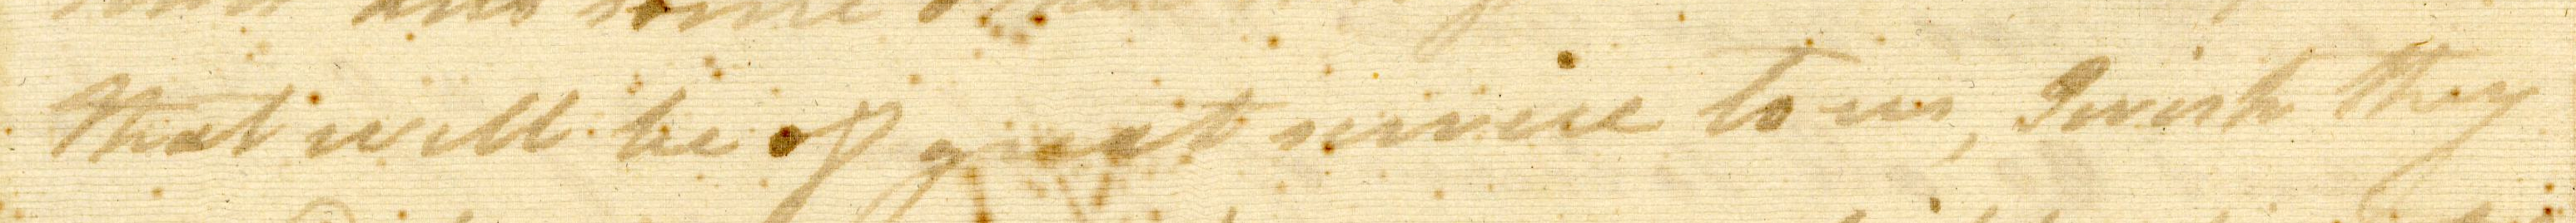that will be of great service to us, I wish they
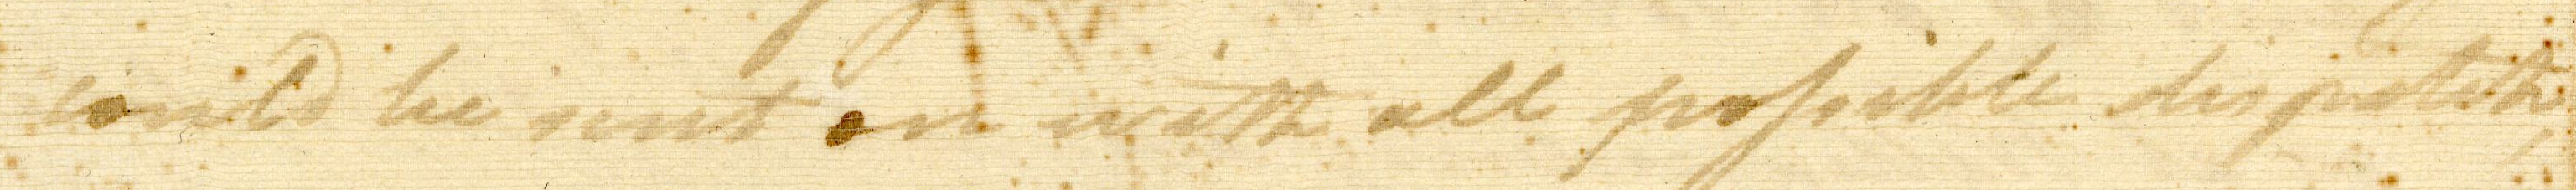could be sent on with all possible dispatch,
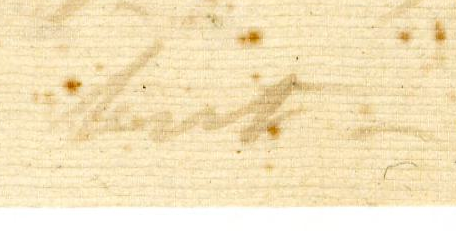but
